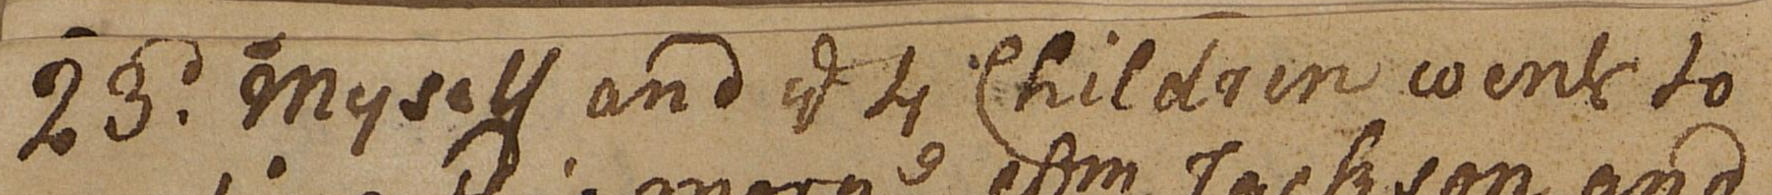23^d. Myself and y^e 4 Children went to
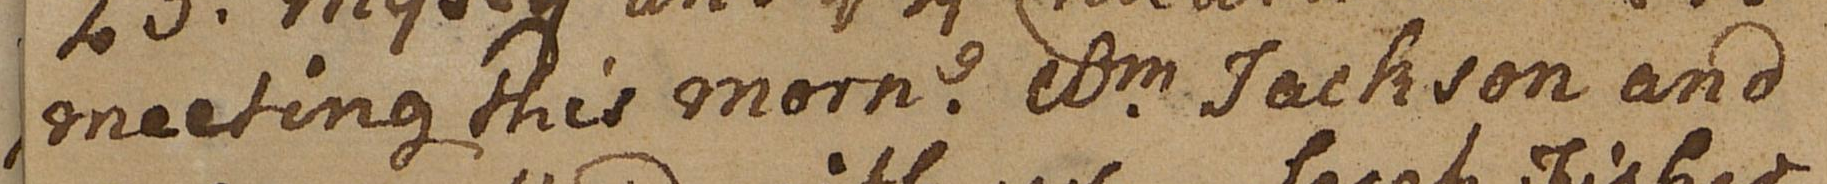meeting this morn^g. W^m. Jackson and
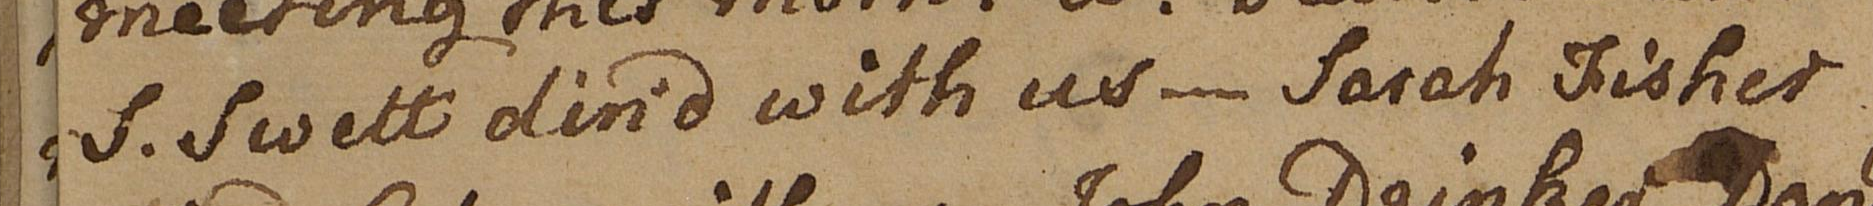S. Swett din'd with us- Sarah Fisher
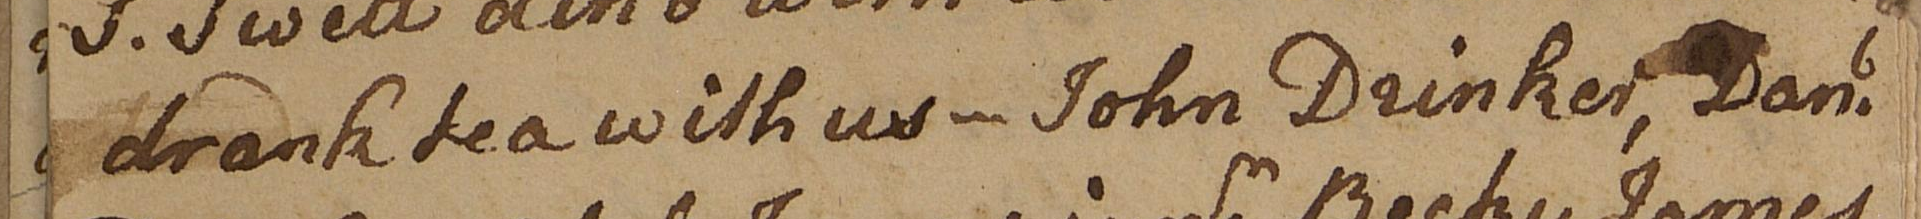drank tea with us- John Drinker, Dan^l.
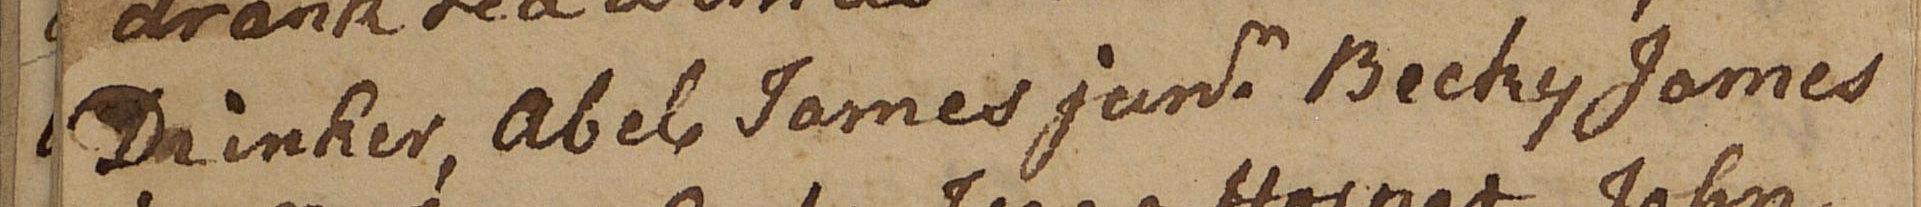Drinker, Abel James jun^r. Becky James
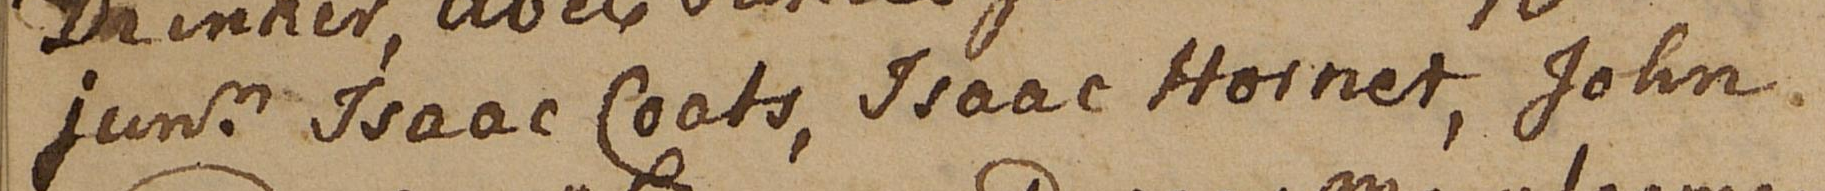jun^r. Isaac Coats, Isaac Hornet, John
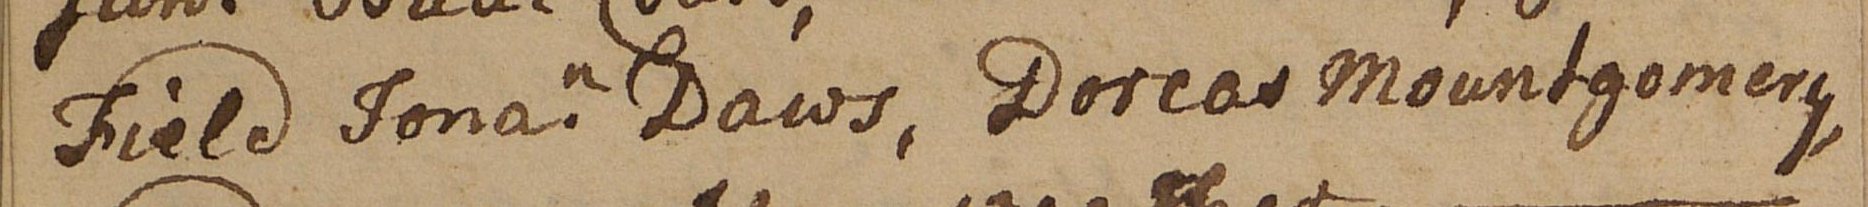Field Jona^n Daws, Dorcas Mountgomery,
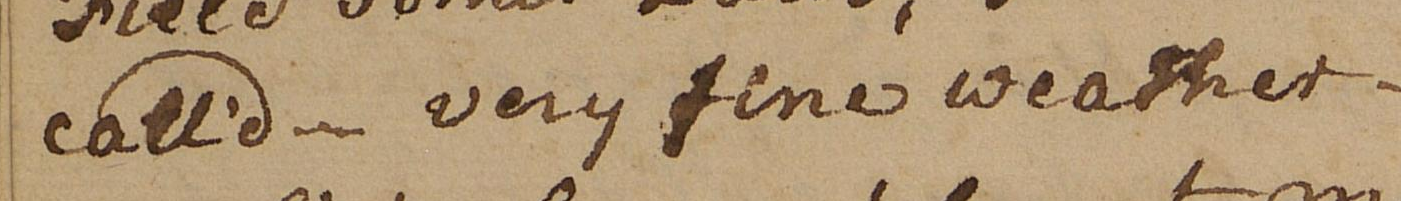call'd- very fine weather
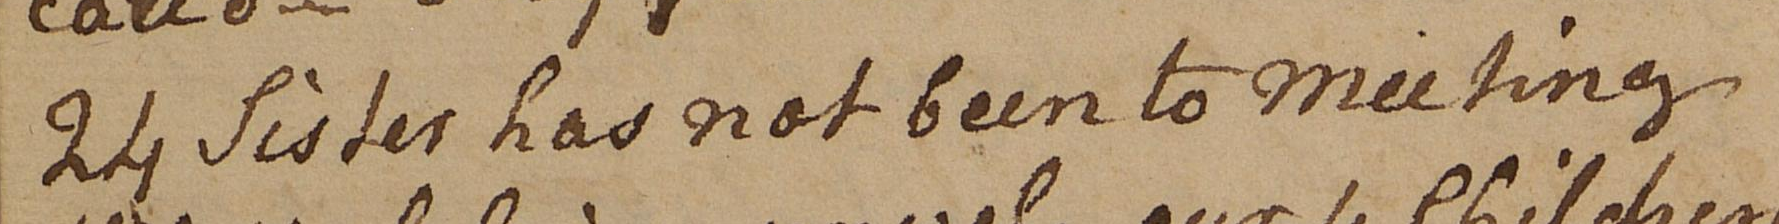24 Sister has not been to Meeting
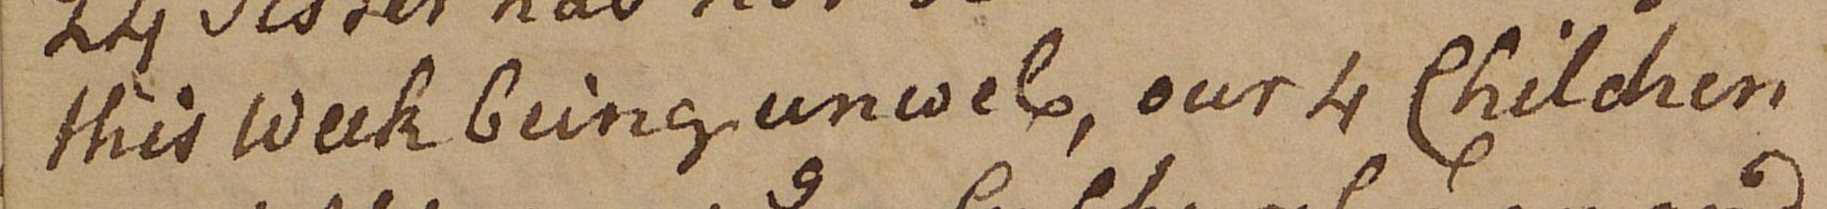this Week being unwel, our 4 Children
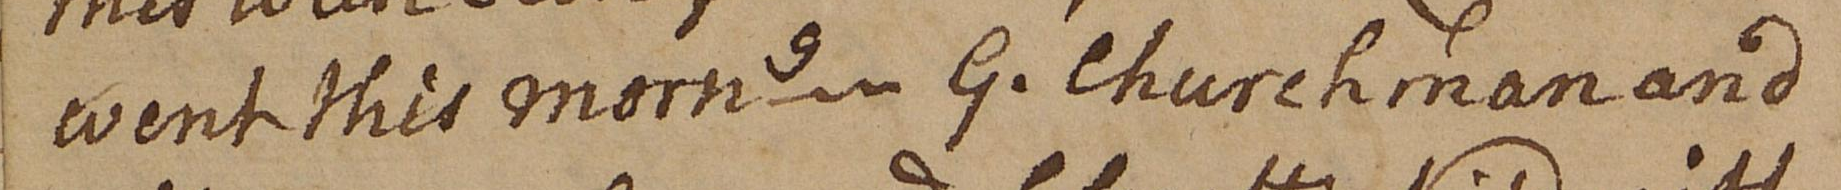went this morn^g.-- G. Churchman and
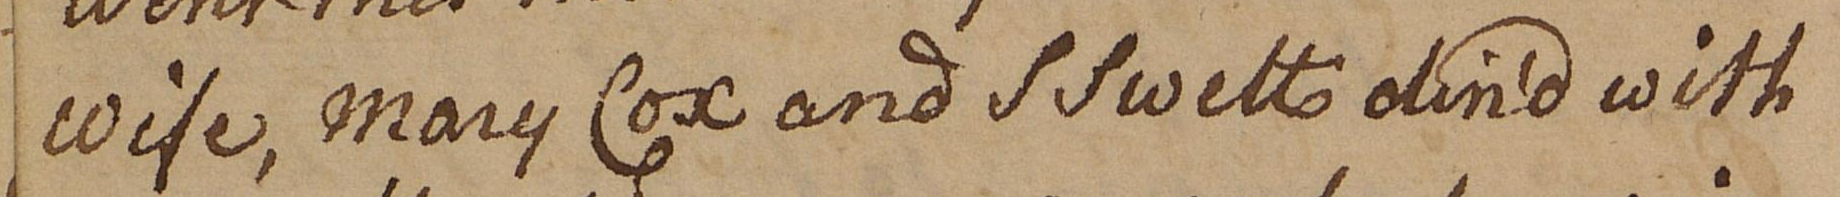Wife, Mary Cox and S Swett din'd with
